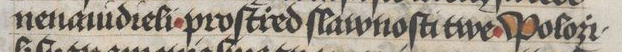nenauidieli.proſtṙed ſlawnoſti twe.Polożi¬
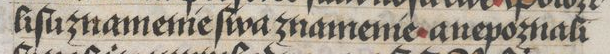li ſu znamenie ſwa znamenie.anepoznali
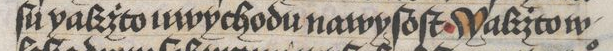ſu yakżto uwychodu nawyſoſt.Yakżto w¬
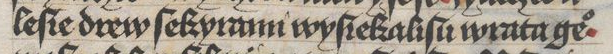leſie drew ſekyrami wyſiekaliſu wrata geo.
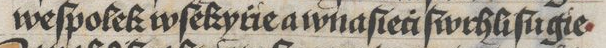weſpolek wſekyṙie a wnaſieċi ſwrhli ſu gie.
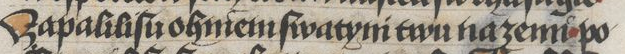Zapaliliſu ohniem ſwatyni twu na zemi.po¬
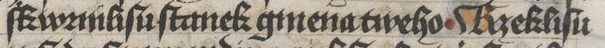kwrniliſu ſtanek gmena tweho.Rzekliſu
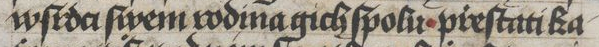wſrdci ſwem rodina gich ſpolu.pṙeſtati ka¬
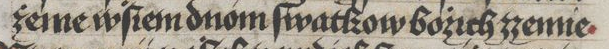żeme wẛiem dnom ſwatkow bożích zzemie.
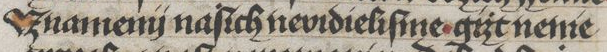Znamienij naẛich nevidieli ſme.gíżt neníe
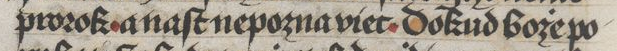prorok.a naſt nepozna viet.Dokud boże po¬
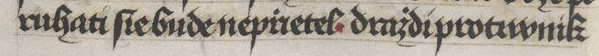ruhati ſie bude nepṙietel.drażdí protiwnik
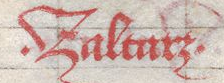.Zaltarz.
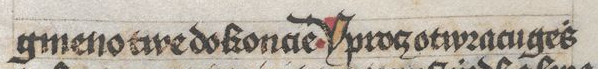gmeno twe dokoncie.Y procz otwracugeṡ
